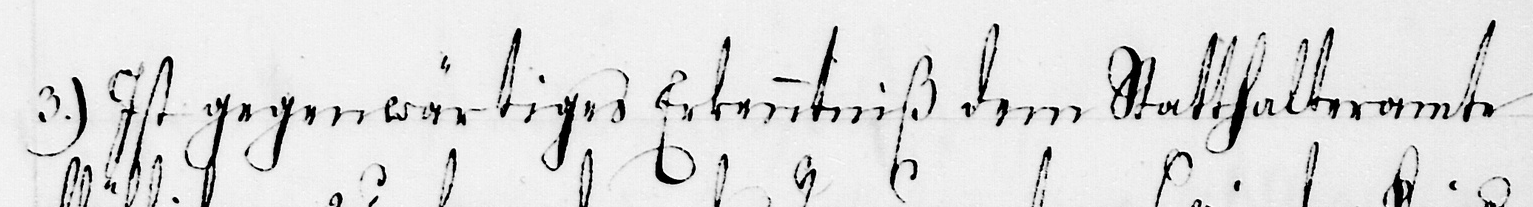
3.) Ist gegenwärtiges Erkenntniß dem Statthalteramte
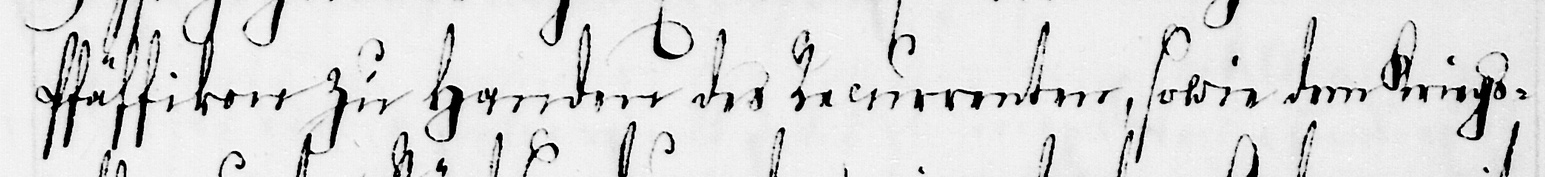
Pfäffikon zu Handen des Recurrenten, sowie dem Kriegs¬
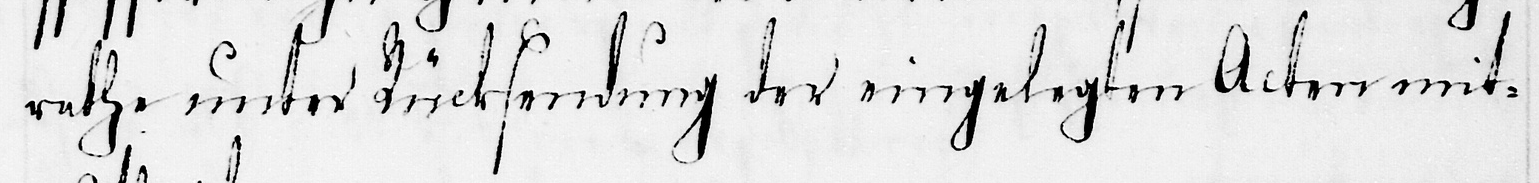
rathe unter Rücksendung der eingelegten Acten mit¬
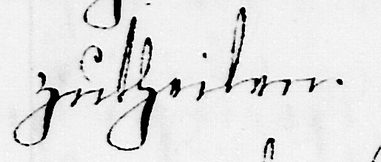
zutheilen.
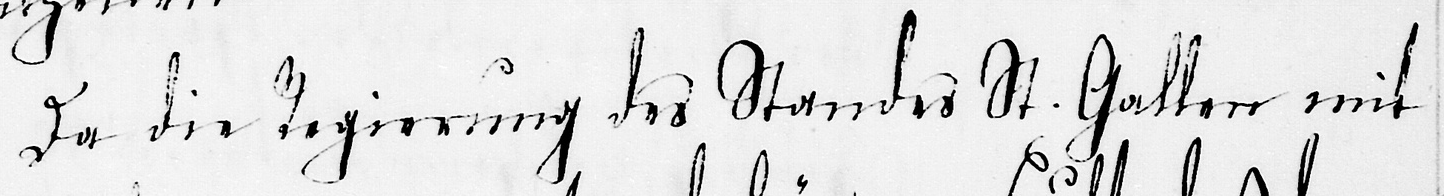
Da die Regierung des Standes St. Gallen mit
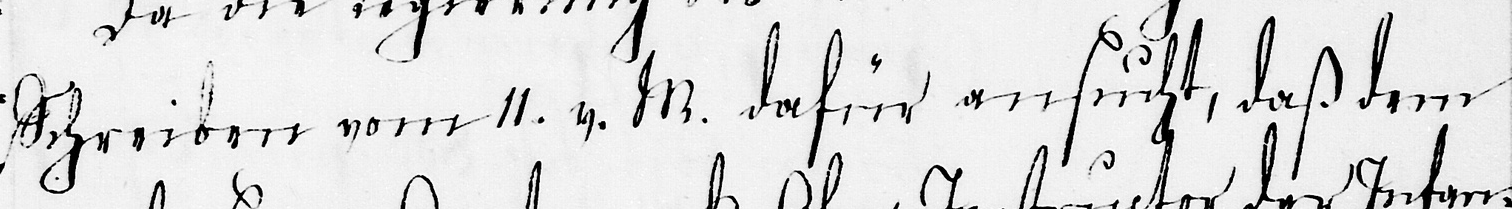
Schreiben vom 11. v. M. dafür ansucht, daß dem
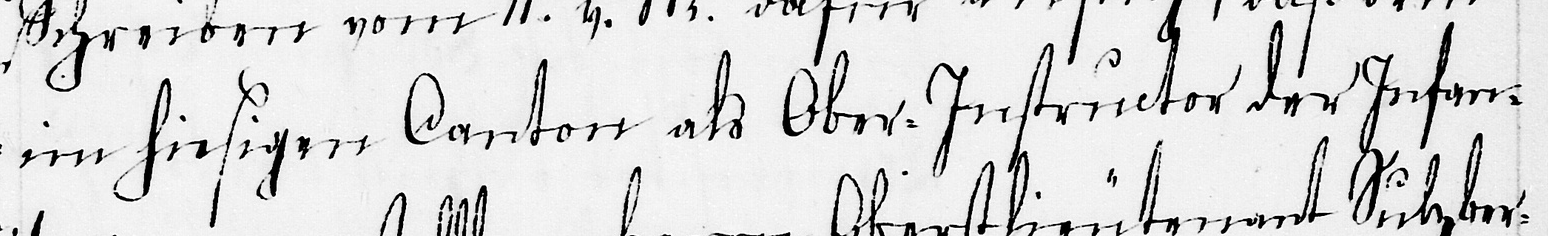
im hiesigen Canton als Ober-Instructor der Infan¬
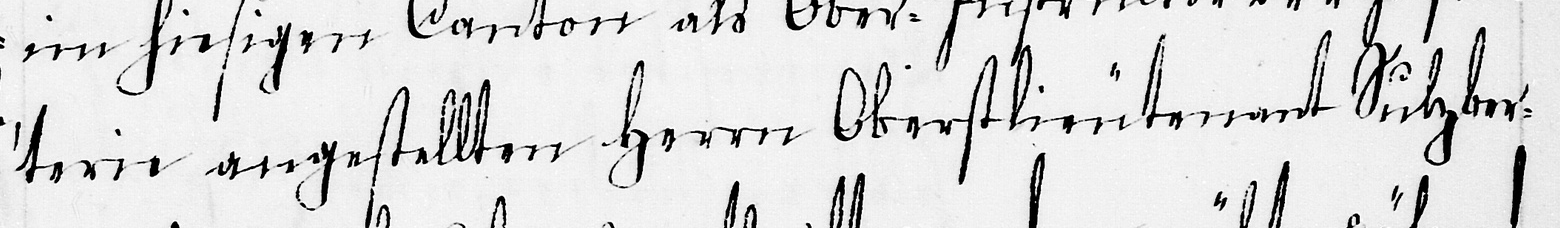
terie angestellten Herrn Oberstlieutenant Sulzber¬
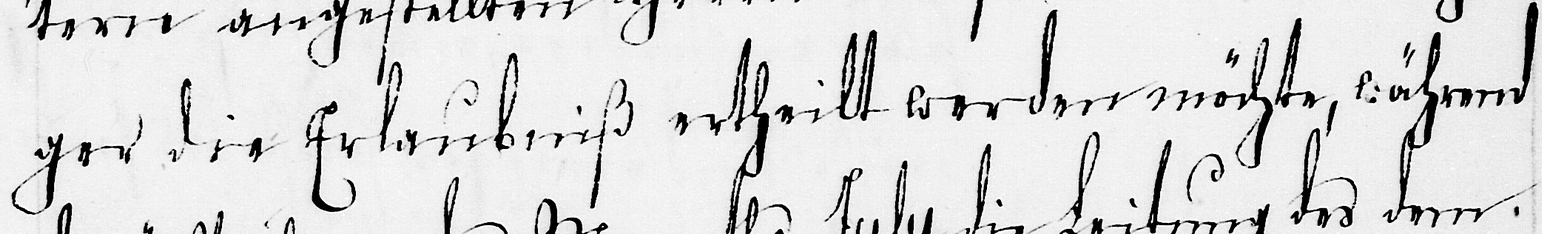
ger die Erlaubniß ertheilt werden möchte, während
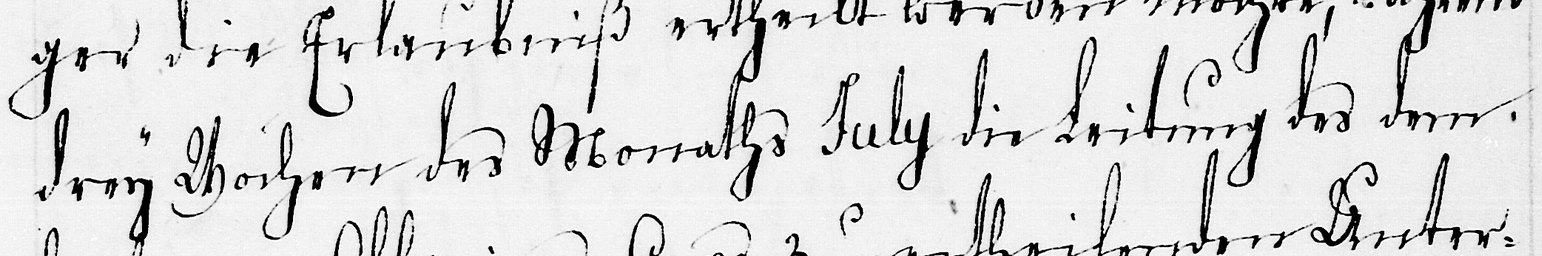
drey Wochen des Monaths July die Leitung des dem
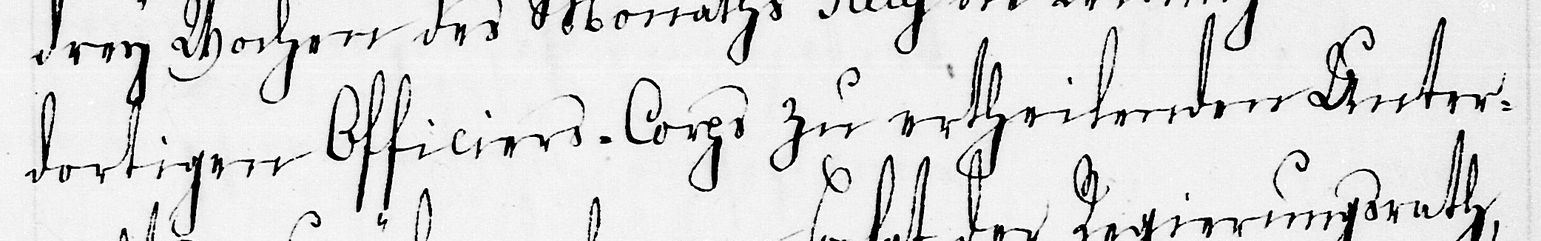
dortigen Officiers-Corps zu ertheilenden Unter¬
